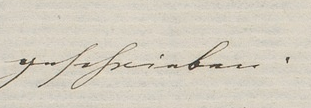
geschrieben.
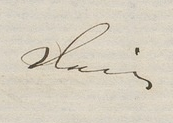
Dein
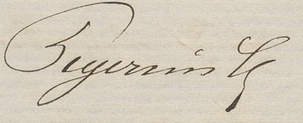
Peyer im Hof
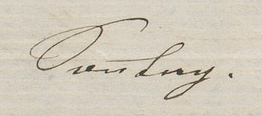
Sonntag.
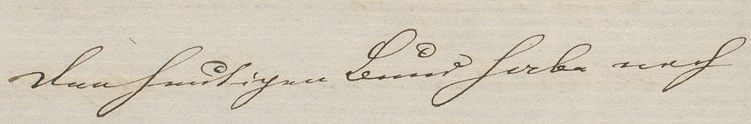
Den heutigen Bund habe noch
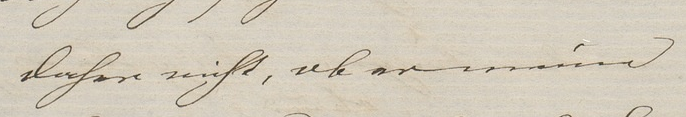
daher nicht, ob er meine
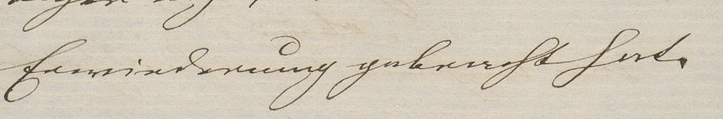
Erwiederung gebracht hat.
